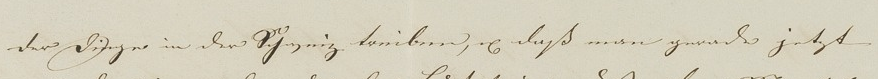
der Dinge in der Schweiz treiben, & daß man gerade jetzt
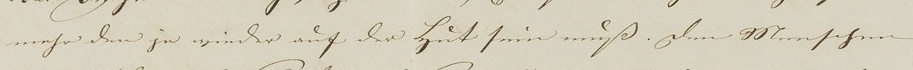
mehr den je wieder auf der Hut sein muß. Den Menschen
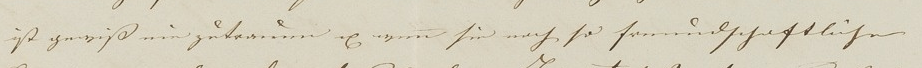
ist gewiß nie zutrauen & wenn sie noch so freundschaftliche
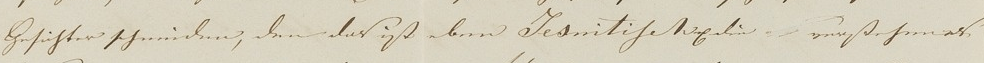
Gesichter schneiden, den das ist eben Jesuitisch & die verstehen es
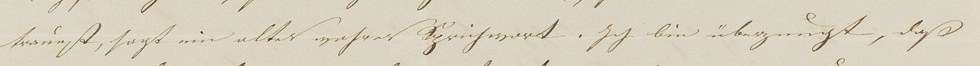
traust, sagt ein altes wahres Sprichwort. Ich bin überzeugt, daß
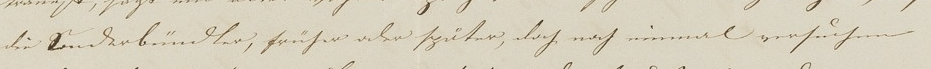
die Sonderbündler, früher oder später, doch noch einmal versuchen
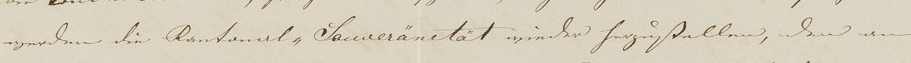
werden die Kantonal-Souveränetät wieder herzustellen, den an
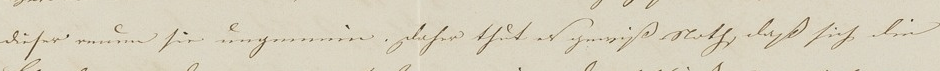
dieser reuen sie ungemein. Daher thut es gewiß Noth, daß sich die
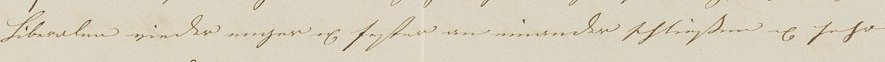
Liberalen wieder enger & fester an einander schließen & sehr
